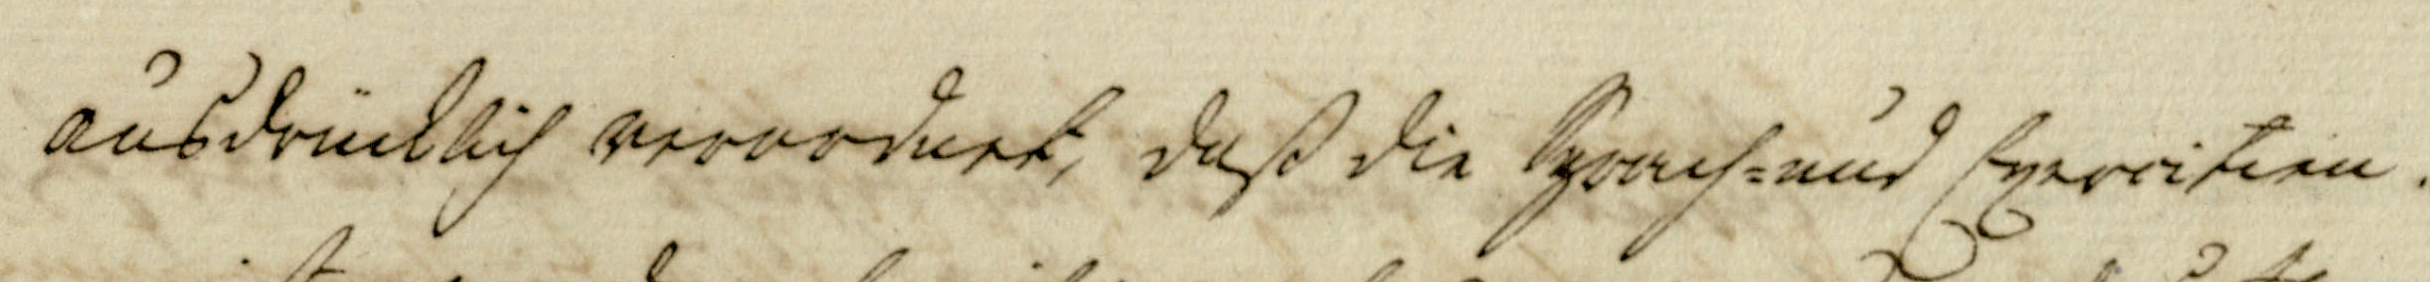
ausdrücklich verordnet, daß die Sprach- und Exercitien¬
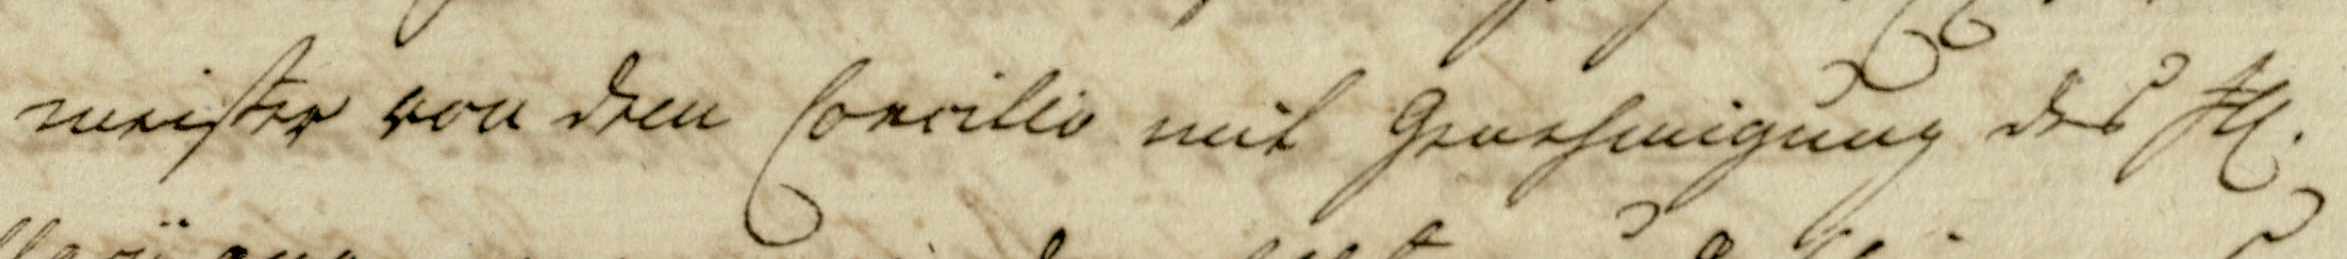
meister von dem Concilio mit Genehmigung des Ill.
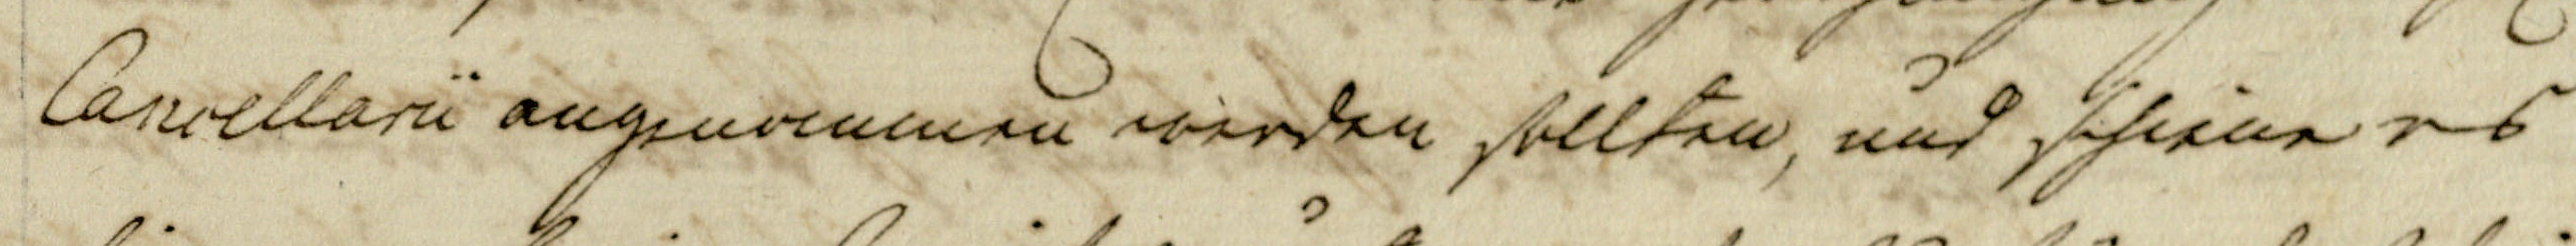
Cancellarii angenommen werden sollten, und schiene es
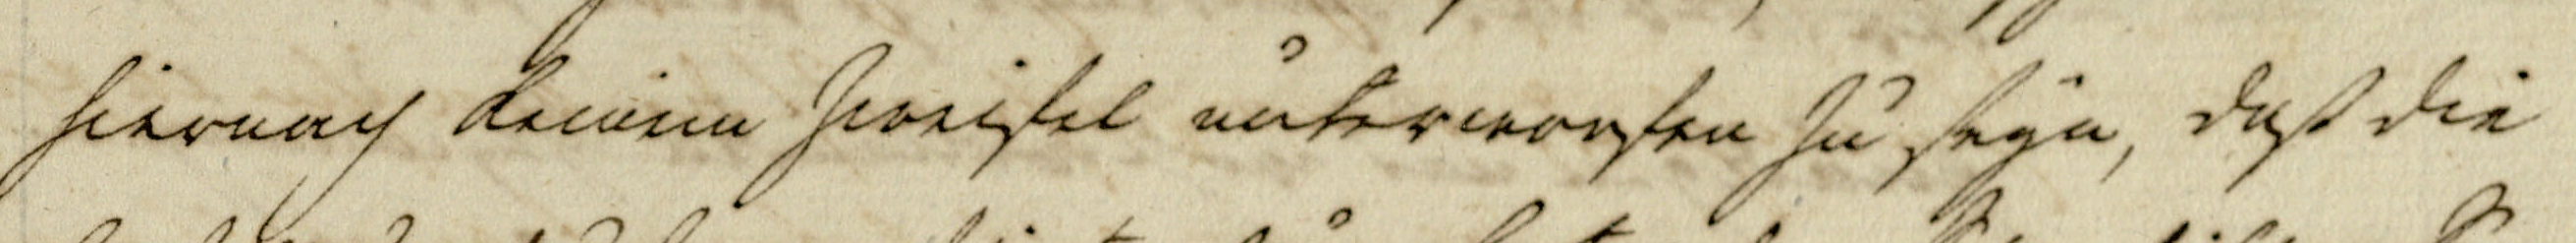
hiernach keinem Zweifel unterworfen zu seÿn, daß die
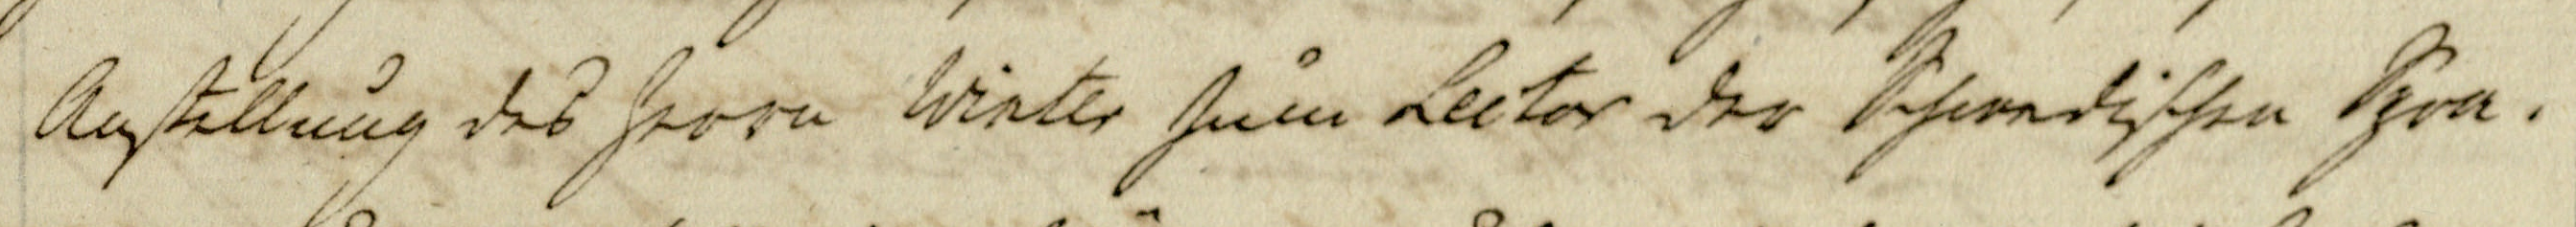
Anstellung des Herrn Winter zum Lector der Schwedischen Spra¬
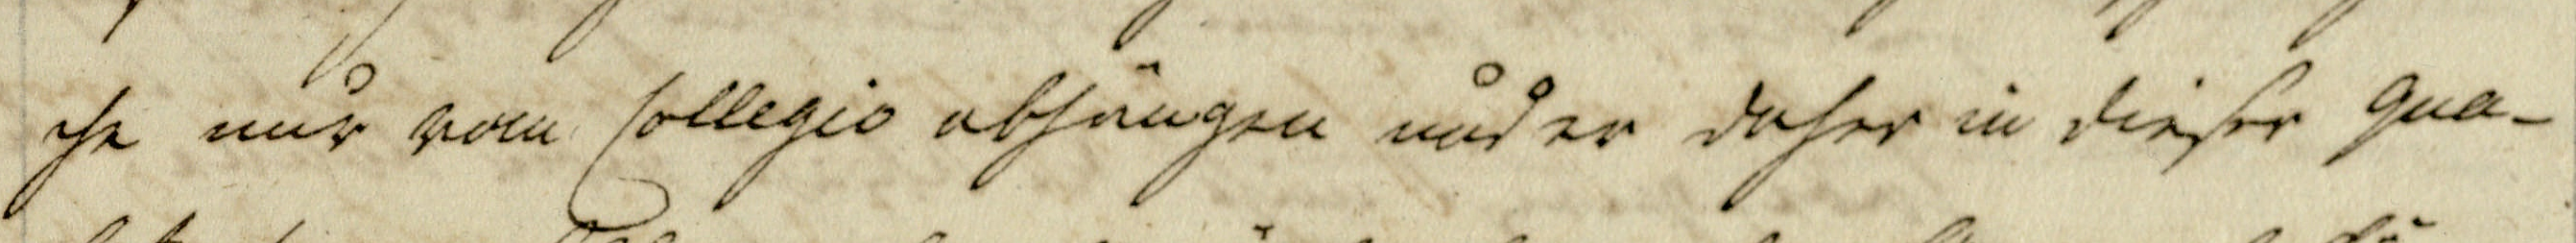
che nur vom Collegio abhängen und er daher in dieser Qua¬
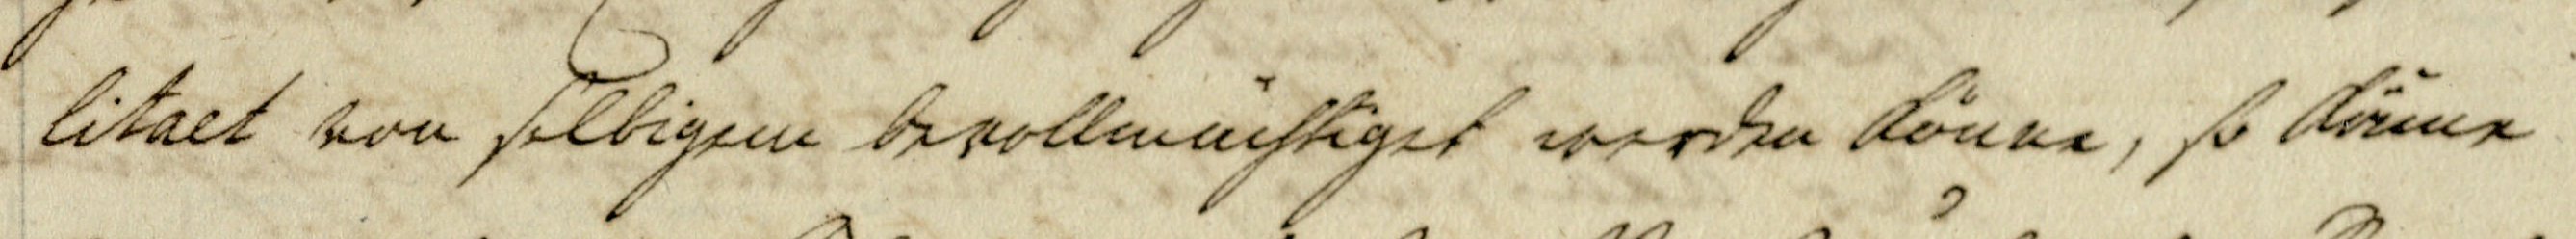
litaet von selbigem bevollmächtiget werden könne, so könne
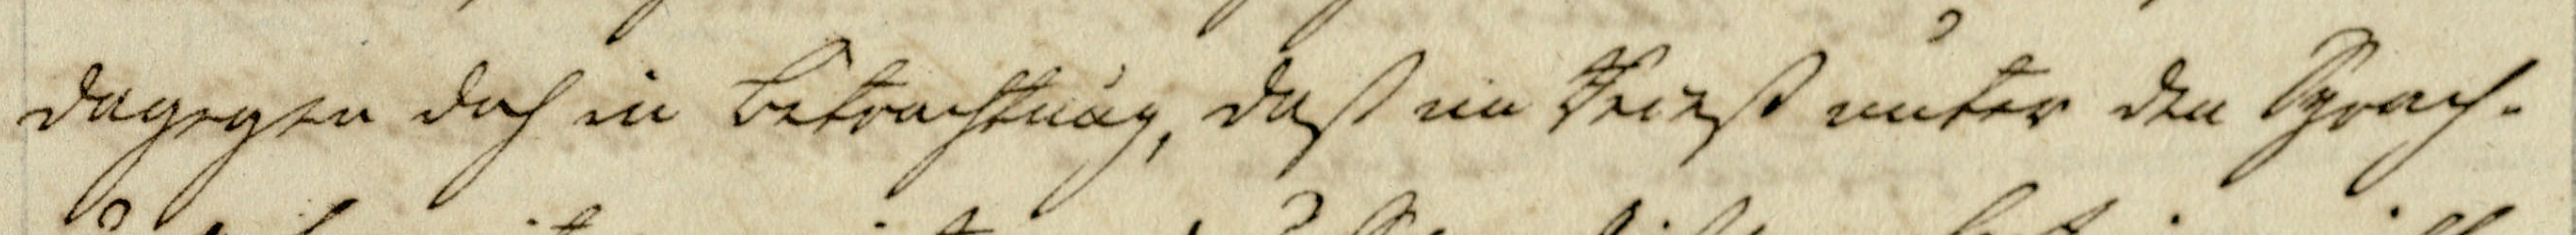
dagegen doch in Betrachtung, daß im Receß unter den Sprach-
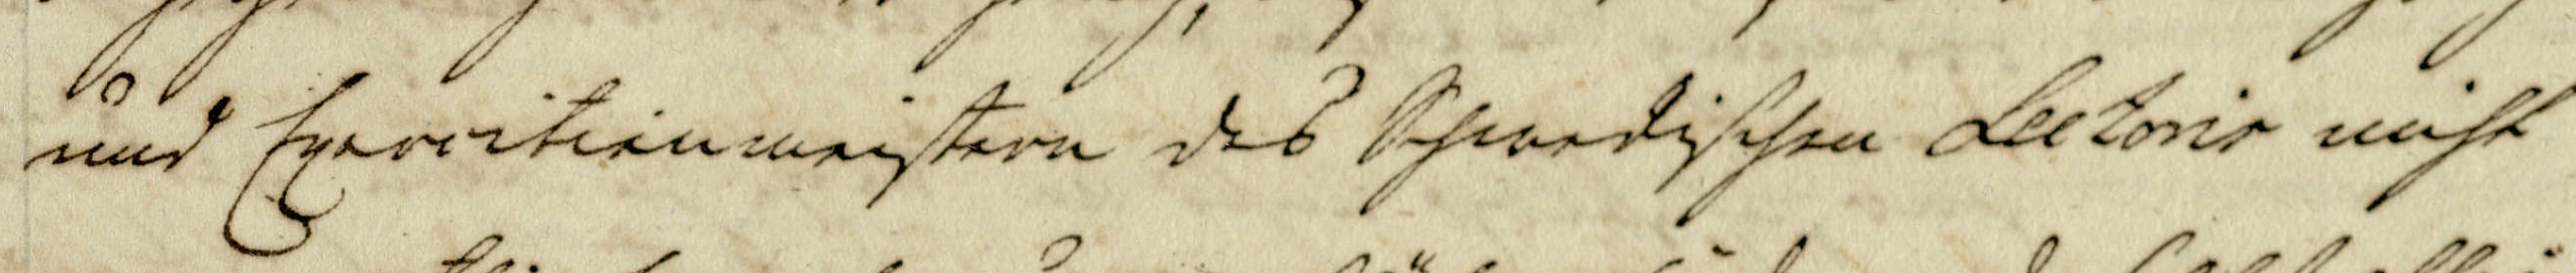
und Exercitienmeistern des Schwedischen Lectoris nicht
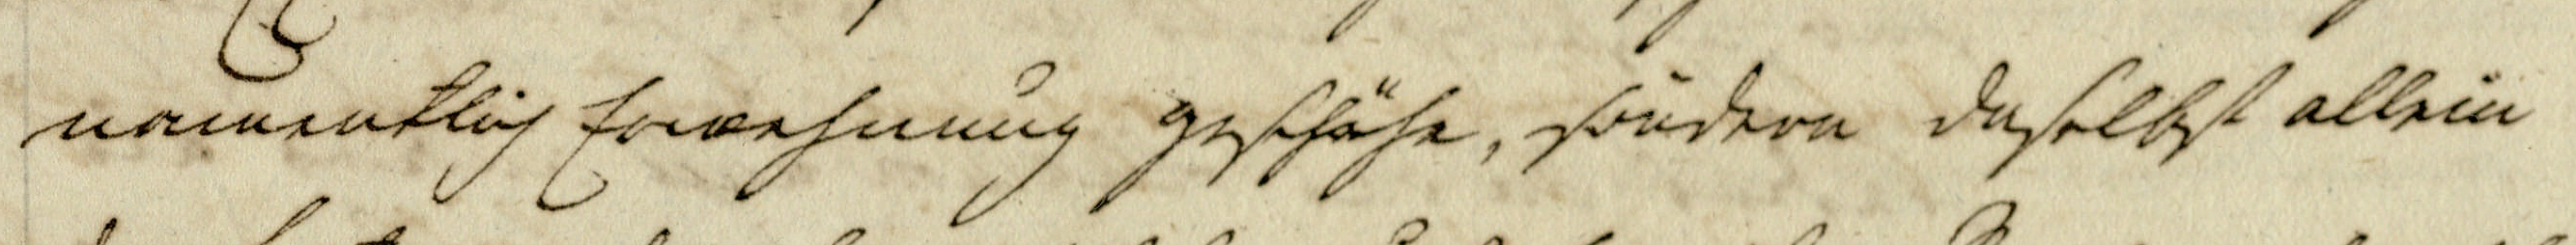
namentlich Erwehnung geschähe, sondern daselbst allein
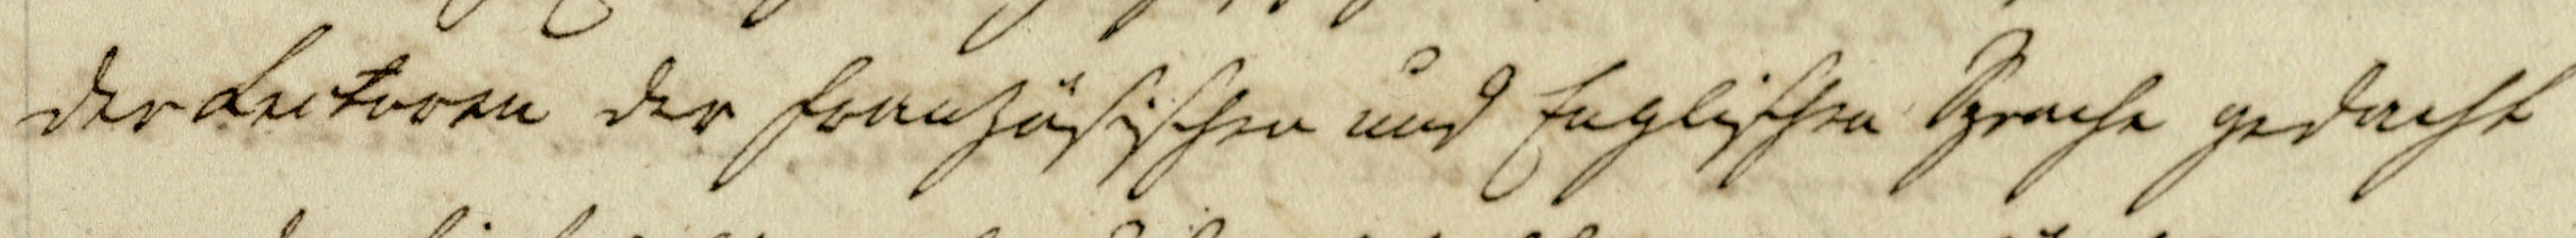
der Lectoren der Französischen und Englischen Sprache gedacht
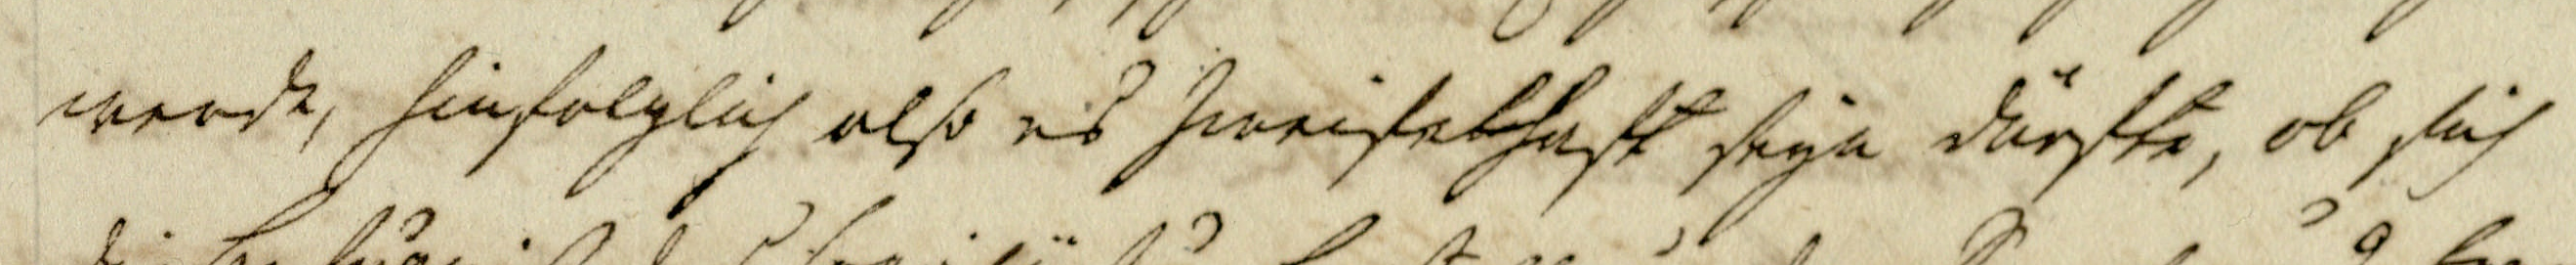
werde, hinfolglich also es zweifelhaft seÿn dürfte, ob sich
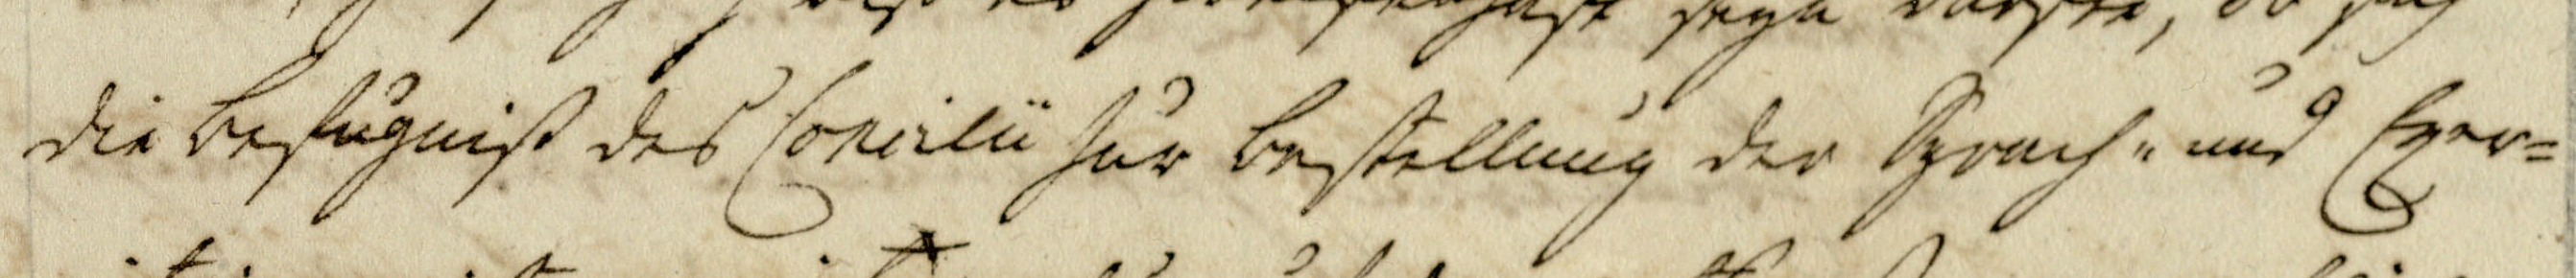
die Befugniß des Concilii zur Bestellung der Sprach- und Exer¬
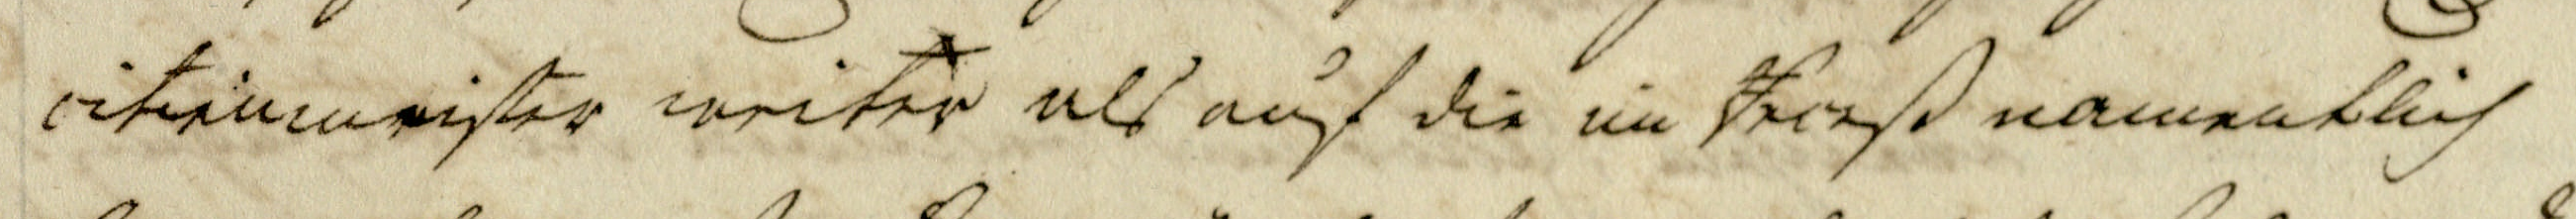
citienmeister weiter als auf die in Receß namentlich
